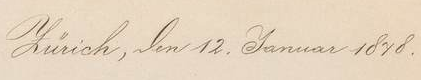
Zürich, den 12. Januar 1878.
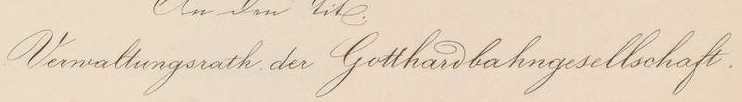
Verwaltungsrath der Gotthardbahngesellschaft.
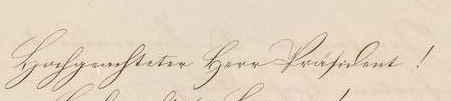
Hochgeachteter Herr Präsident!
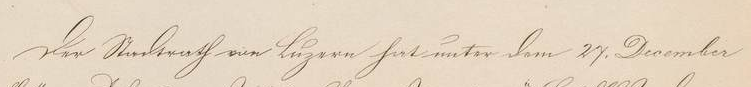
Der Stadtrath von Luzern hat unter dem 27. December
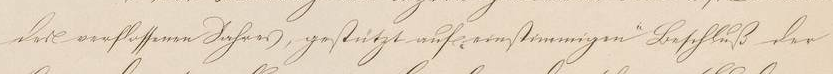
des verflossenen Jahres, gestützt auf «einstimmigen» Beschluß der
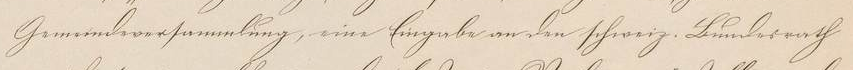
Gemeindeversammlung, eine Eingabe an den schweiz. Bundesrath
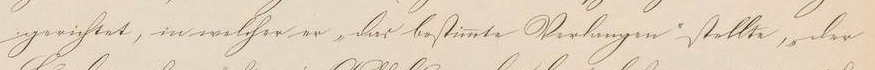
gerichtet, in welcher er «das bestimmte Verlangen» stellte, «der
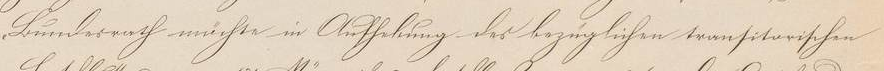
Bundesrath möchte in Aufhebung des bezüglichen transitorischen
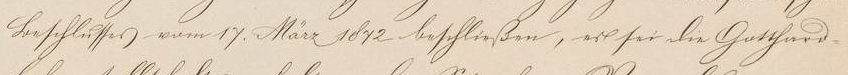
Beschlusses vom 17. März 1872 beschließen, es sei die Gotthard-
